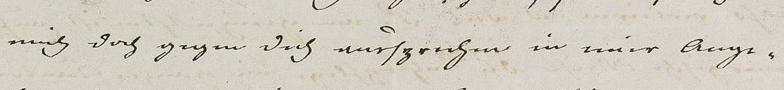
mich doch gegen dich aussprechen in einer Ange-
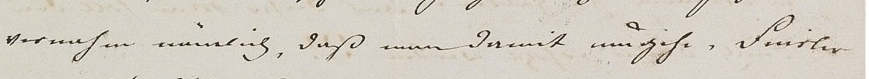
vernahm nämlich, daß man damit umgehe, Finsler
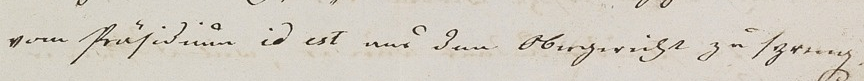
vom Präsidium id est aus dem Obergericht zu sprengen.
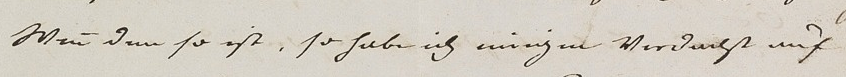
Wenn dem so ist, so habe ich einigen Verdacht auf
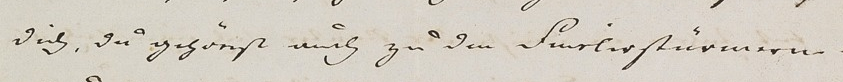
dich, du gehörest auch zu den Finslerstürmern. –
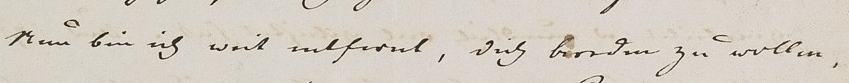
Nun bin ich weit entfernt, dich bereden zu wollen,
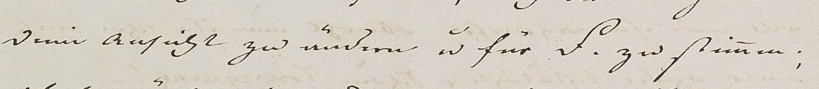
deine Ansicht zu ändern u für F. zu stimmen;
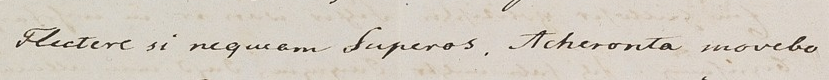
Flectere si nequeam Superos, Acheronta movebo –
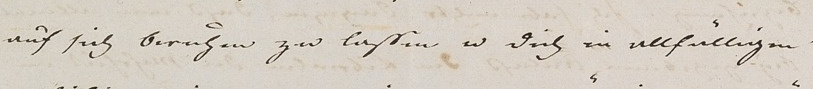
auf sich beruhen zu lassen u dich in allfälligen
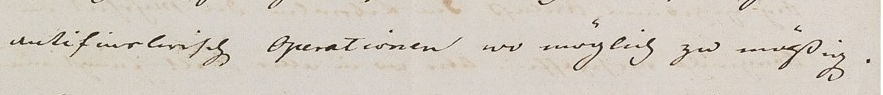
antifinslerischen Operationen wo möglich zu mäßigen.
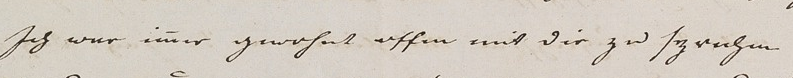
Ich war immer gewohnt offen mit dir zu sprechen
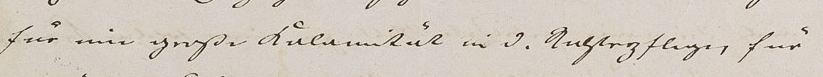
für eine große Kalamität in d. Rechtspflege, für
